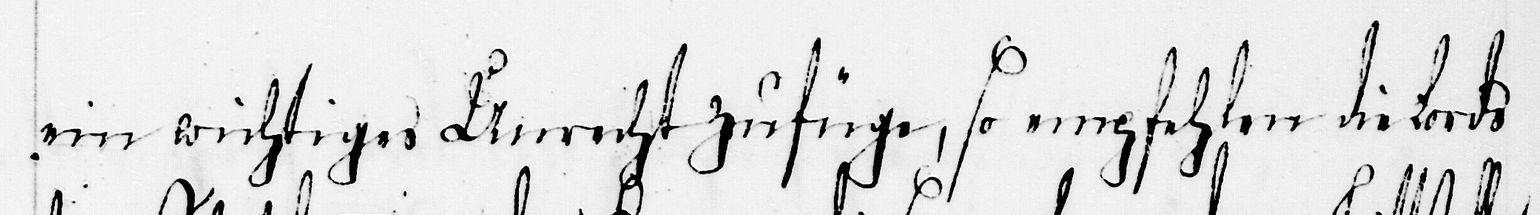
ein wichtiges Unrecht zufüge, so empfehlen die Lords
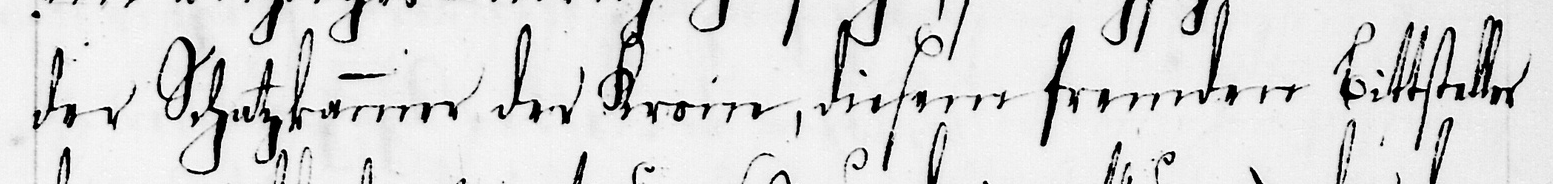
der Schatzkammer der Krone, diesem fremden Bittstell¬
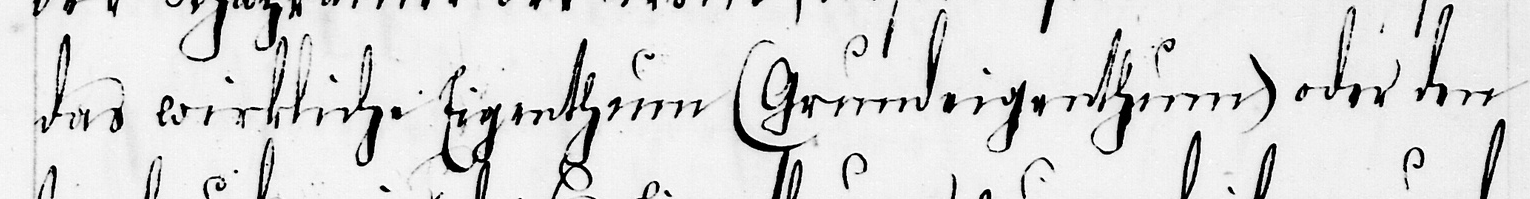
das wirkliche Eigenthum (Grundeigenthum) oder den
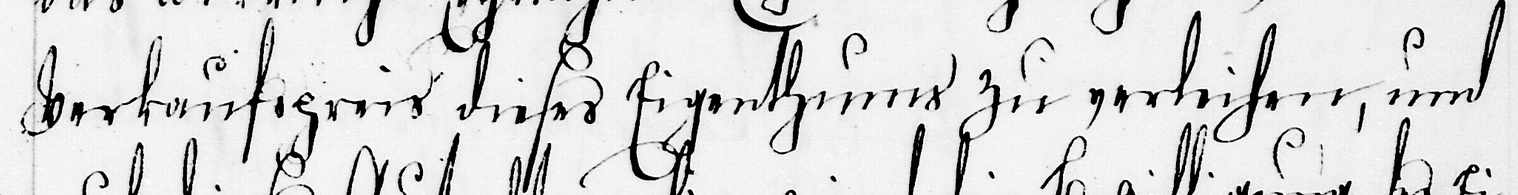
Verkaufspreis dieses Eigenthums zu verleihen, und
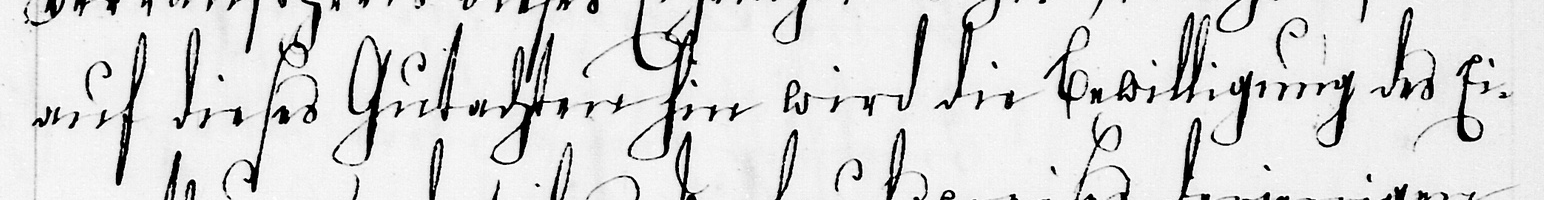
auf dieses Gutachten hin wird die Bewilligung des Ei¬
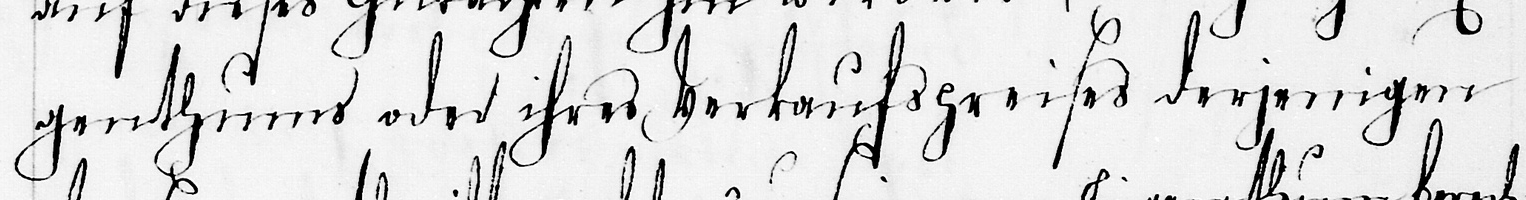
genthums oder ihres Verkaufspreises derjenigen
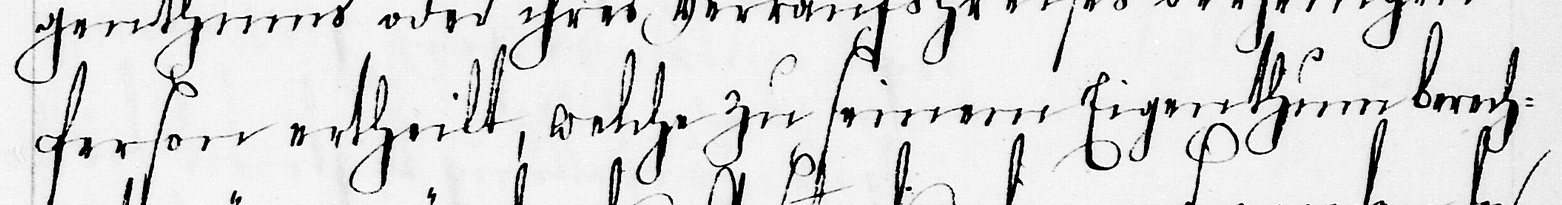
Person ertheilt, welche zu seinem Eigenthum berech¬
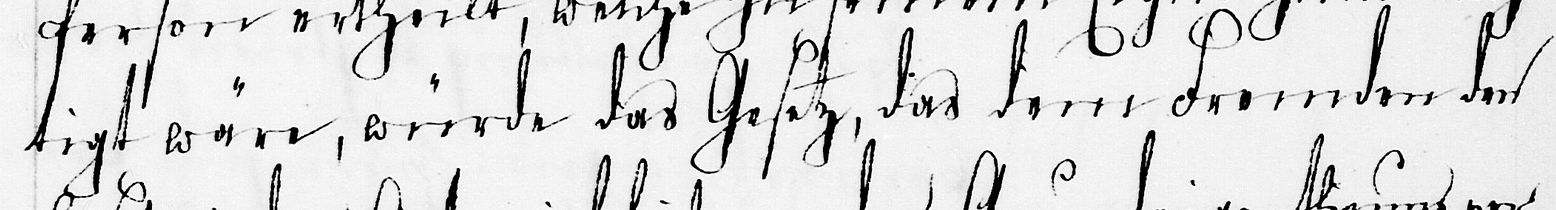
tigt wäre, würde das Gesetz, das dem Fremden den
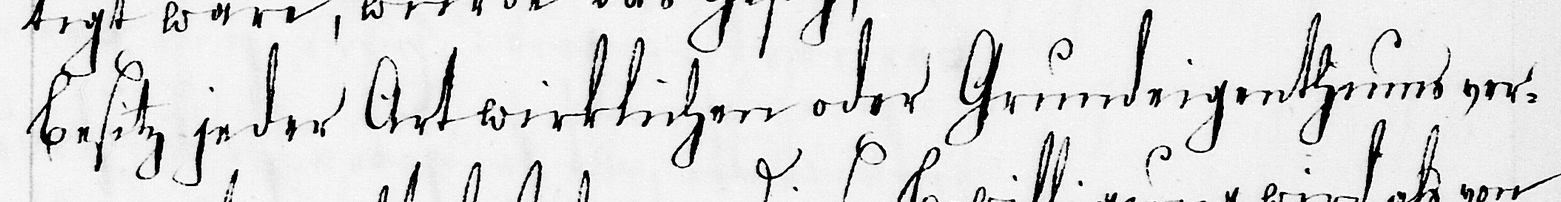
Besitz jeder Art wirklichen oder Grundeigenthums ver¬
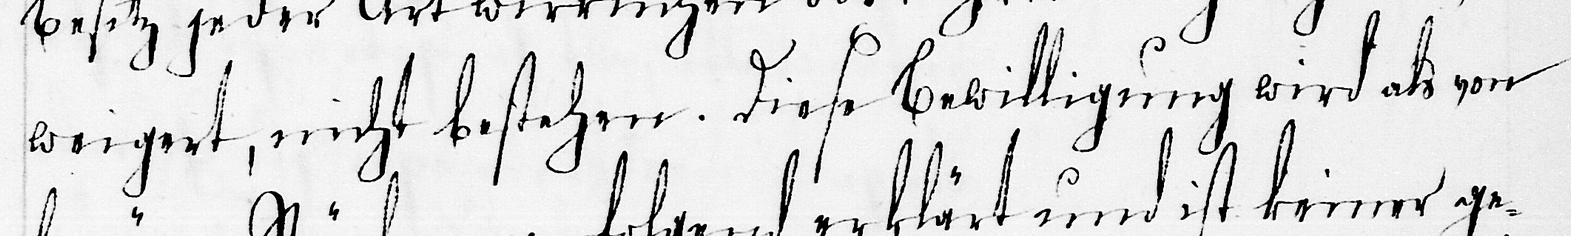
weigert, nicht bestehen. Diese Bewilligung wird als von
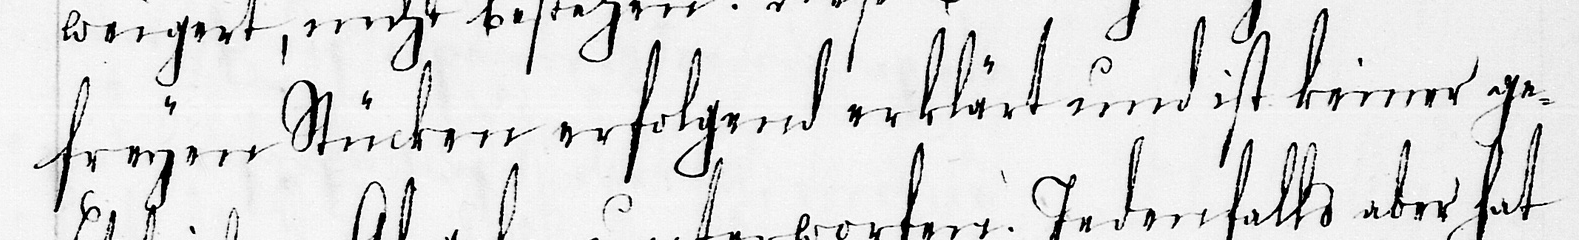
freyen Stücken erfolgend erklärt und ist keiner ge¬
